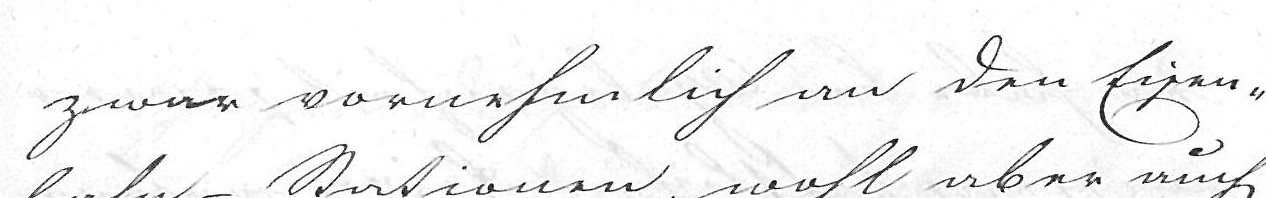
zwar vornehmlich an den Eisen-
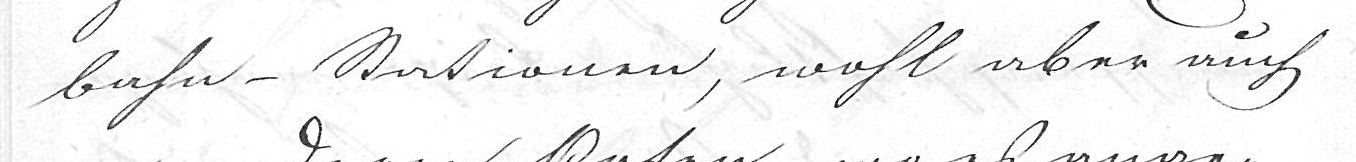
bahn-Stationen, wohl aber auch
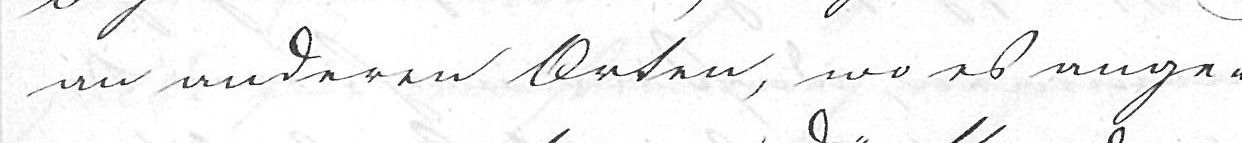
an anderen Orten, wo es ange-
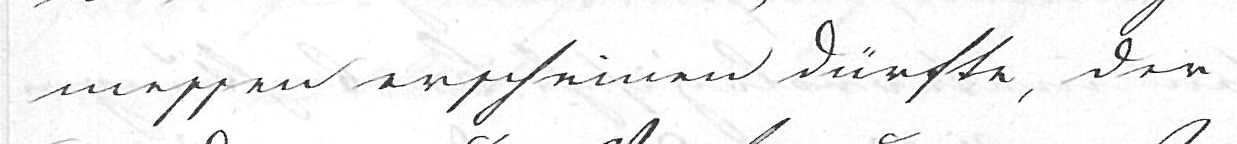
messen erscheinen dürfte, der
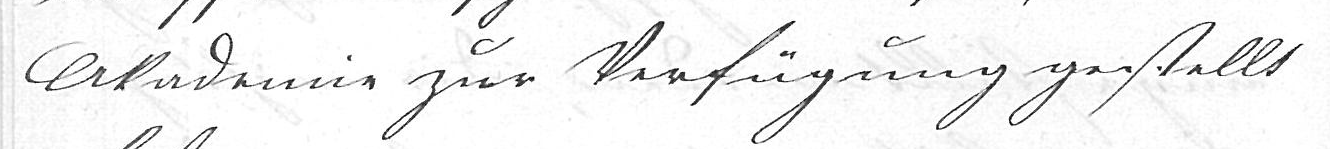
Akademie zur Verfügung gestellt
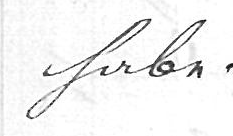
habe.
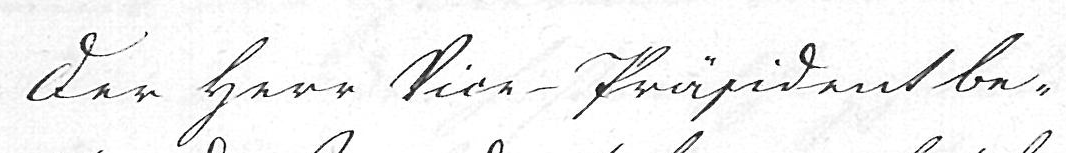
Der Herr Vice-Präsident be-
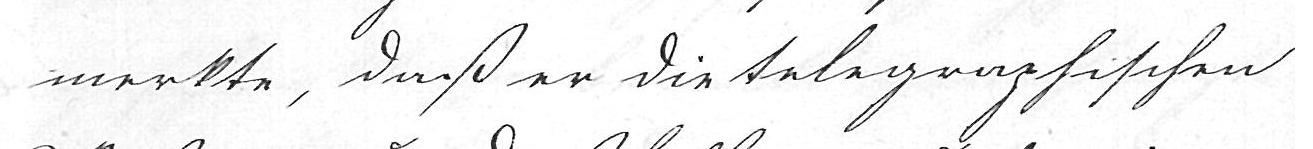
merkt, daß er die telegraphischen
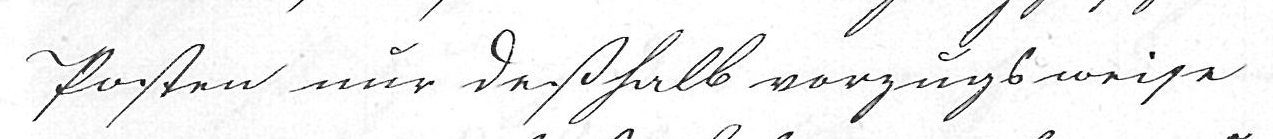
Posten nur deßhalb vorzugsweise
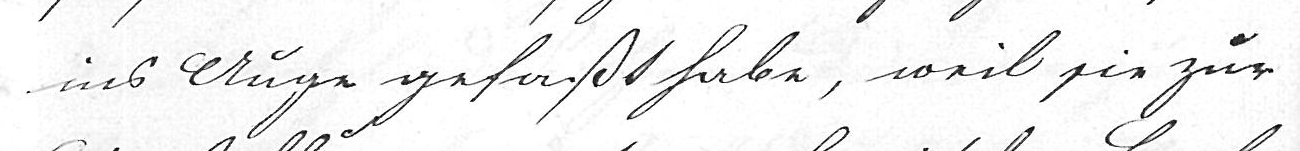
in Auge gefaßt habe, weil sie zur
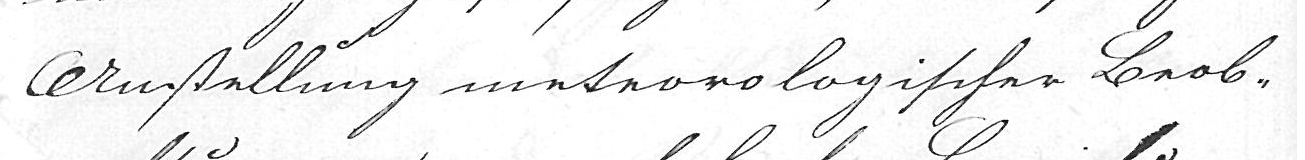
Anstellung meteorologischer Beob-
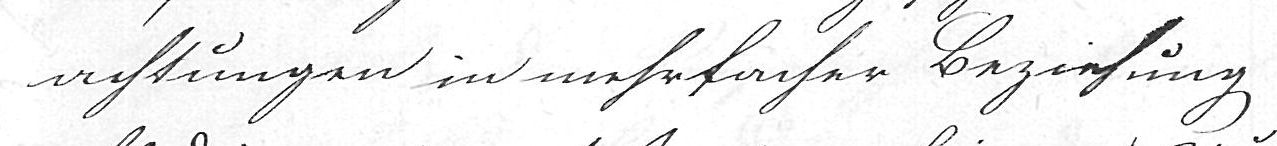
achtungen in mehrfacher Beziehung
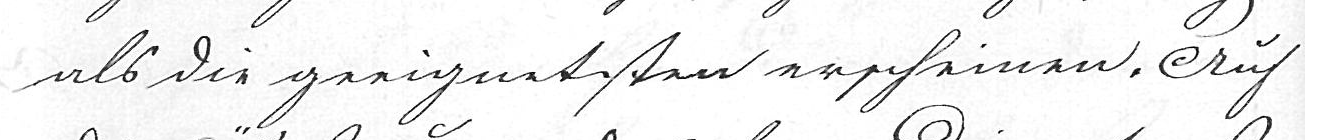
als die geignetsten erscheinen. Auf
